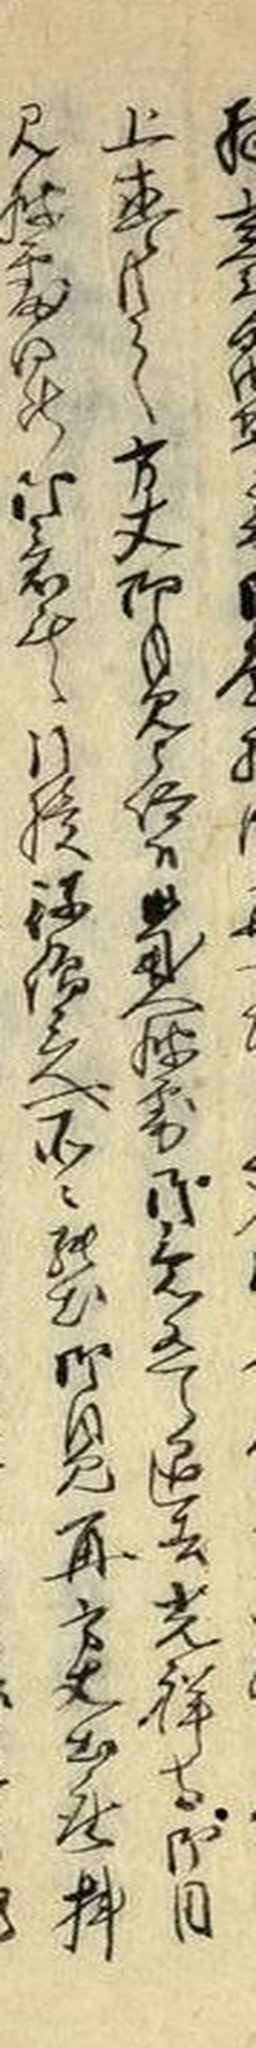見披露同断御意無之引続役僧三人一所ニ罷出御目見再方丈出座拝
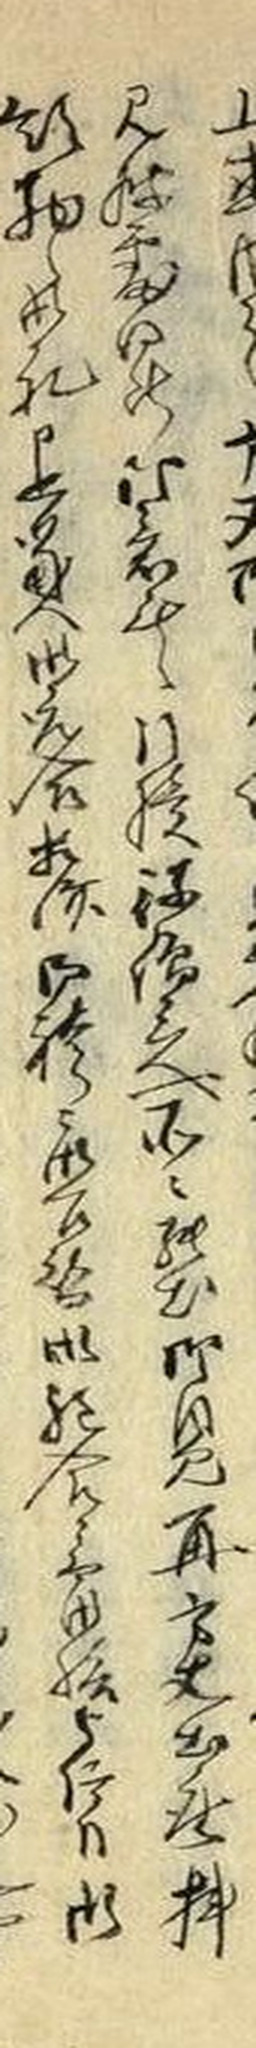領物之御礼申上御用人御取合相済御袴ニ御召替御程合ニ而御膳被仰付御
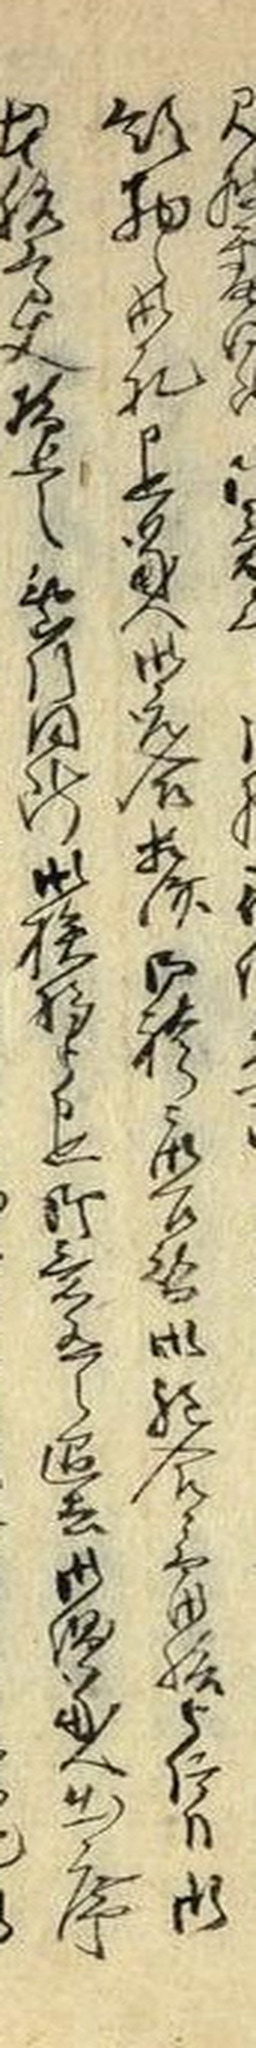本膳方丈指上之台引同断御挨拶被申上御意有之退去御側御用人出席
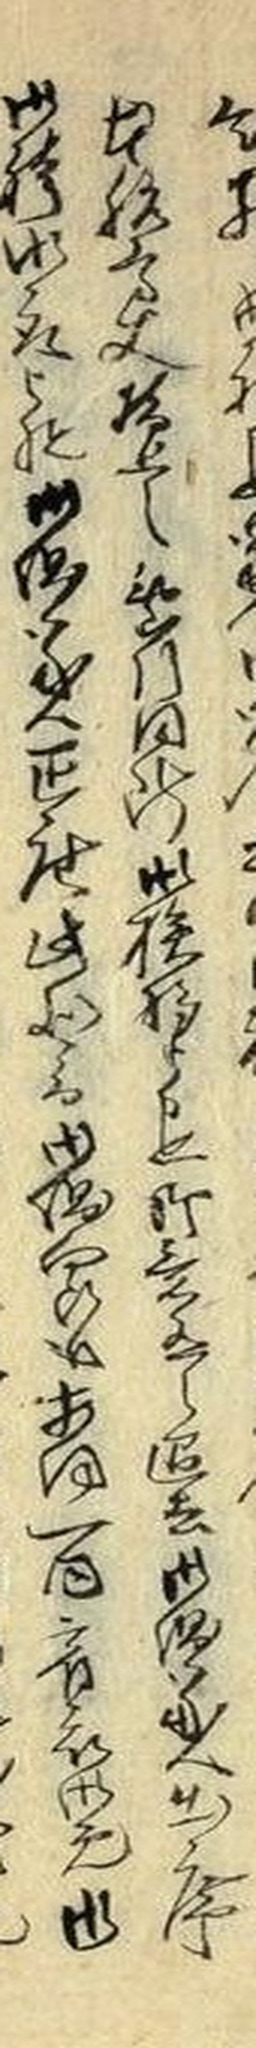御袴御取被遊御側御用人正座此処ニ而御側向頭取相伺一同肩衣御免御
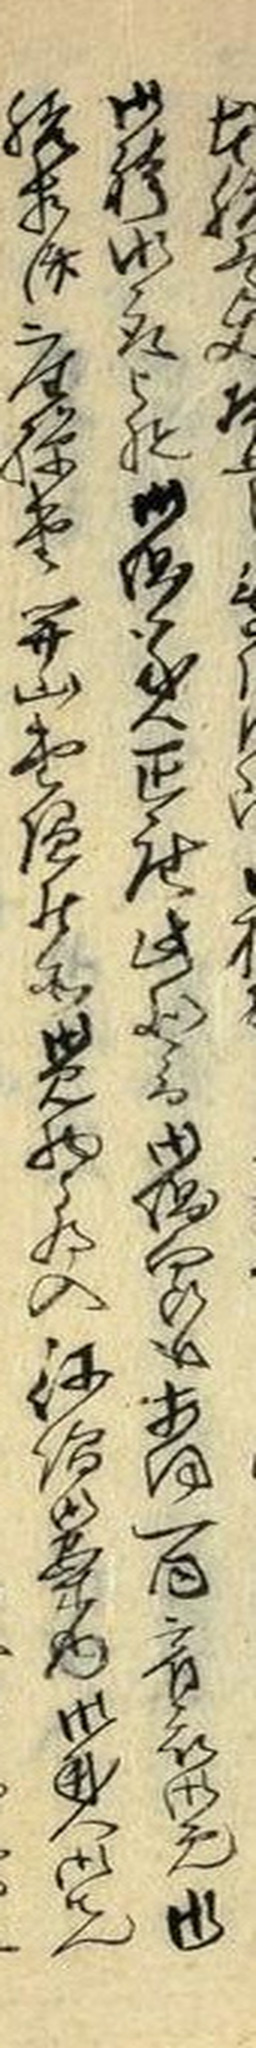膳相済座禅堂開山堂隠居所御見物被為入役僧御案内御用人御先
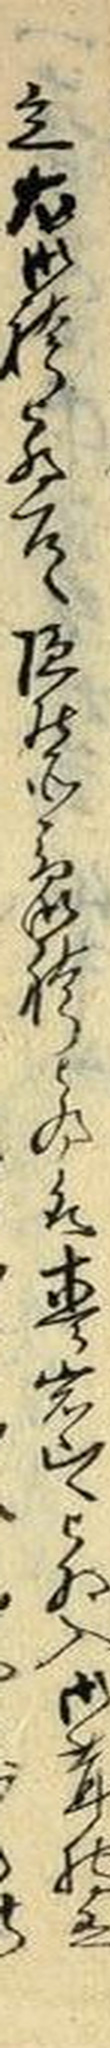立尤御袴被召候隠居所ニ而御袴被為取直ニ岩山へ被為入御茸狩有
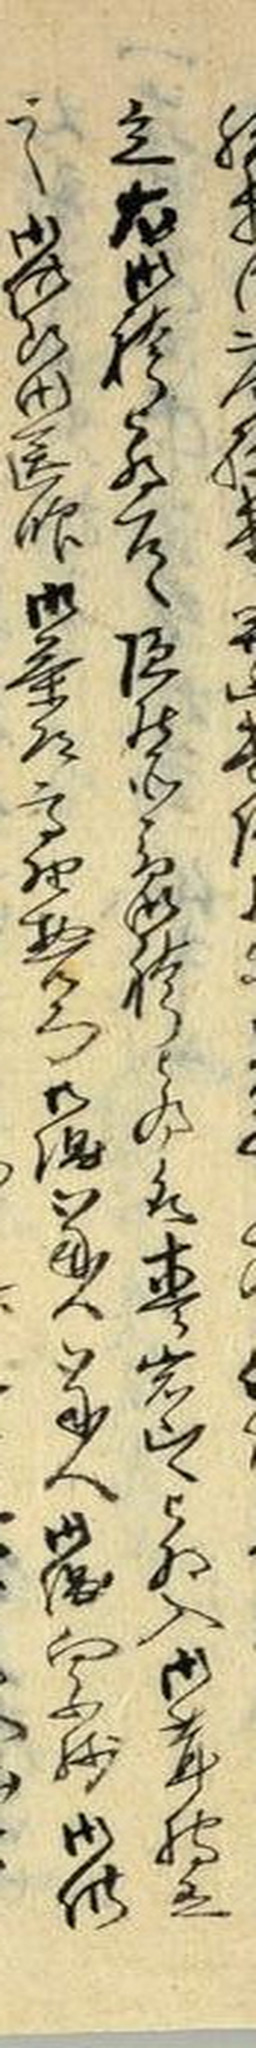之御供頭御医師御茶道高野惣左衛門御側御用人御用人御側向不残御供
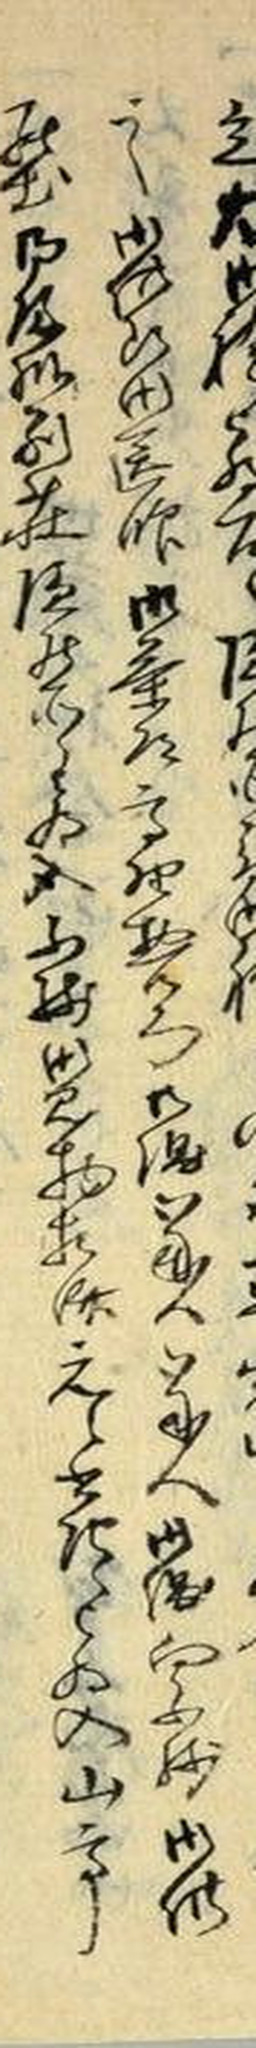罷出御帰掛別荘隠居所へ被為入不残御見物相済元之書院へ被為入山亭
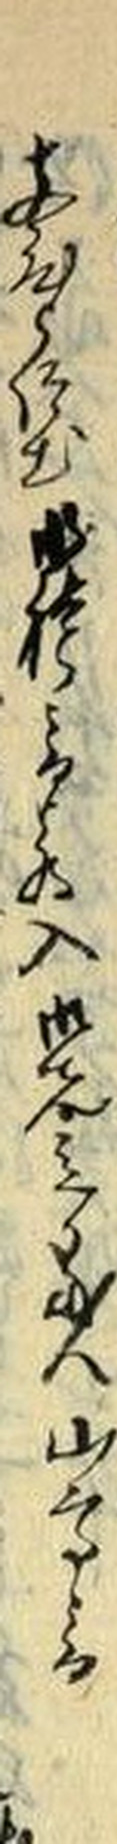支度被仰出御袴ニ而被為入御先立御用人山亭ニ而
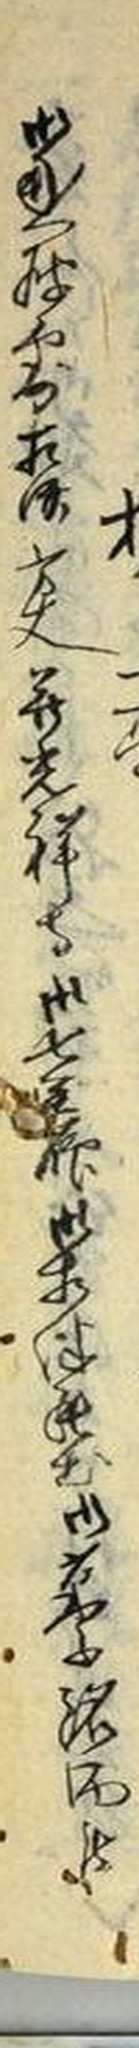御用人披露相済方丈并光祥寺御匙医師御相伴罷出御菓子銘酒被
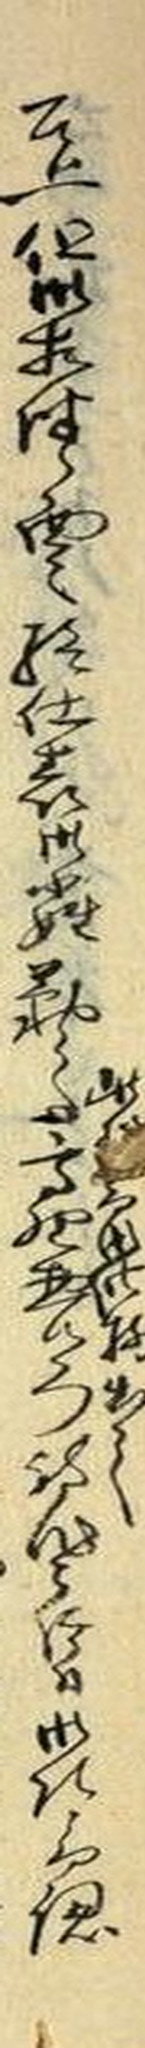召上但御相伴之面々給仕表御小姓勤之候事高野惣左衛門詩作被仰付御次ニ而認
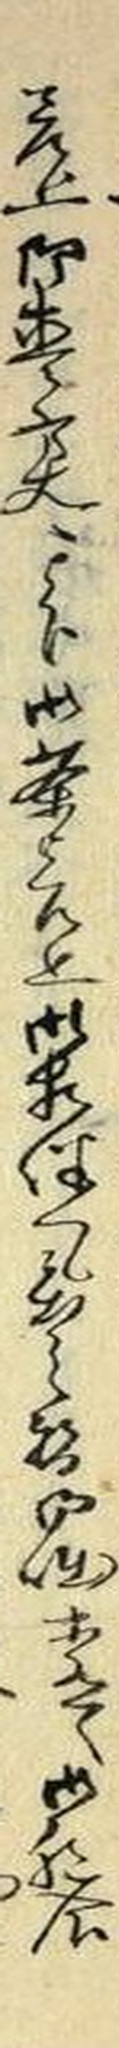差上御直ニ方丈へ被下御茶被召上御相伴へも出之暫御咄等有之御程合
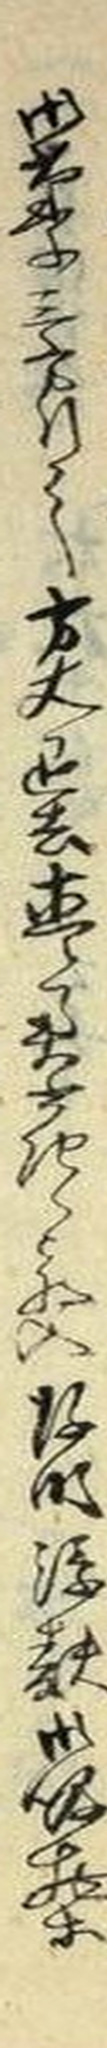御菓子三方引之方丈退去直ニ奥書院へ被為入後段浮麩御吸物等
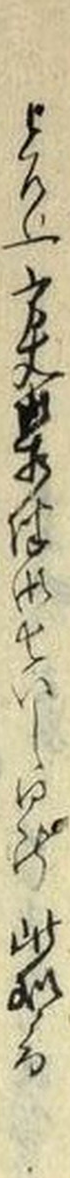被召上方丈御相伴御匙いし同断此所処ニ而
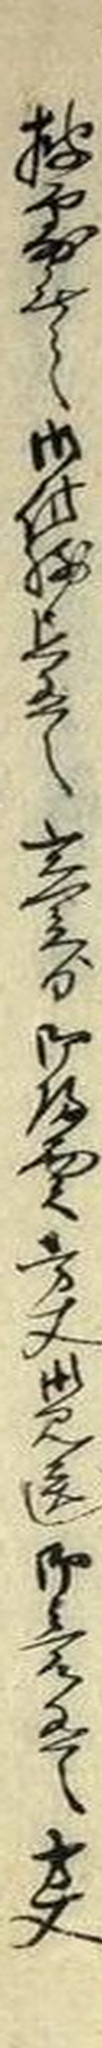披露無之御供揃申上有之玄関ゟ御帰殿方丈御見送御意有之方丈
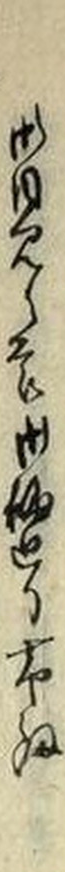御目見候節御側廻帯釼
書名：少傅日録抄（斉承付側向頭取日記、在国）
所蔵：福井県文書館 Fukui Prefectural Archives
